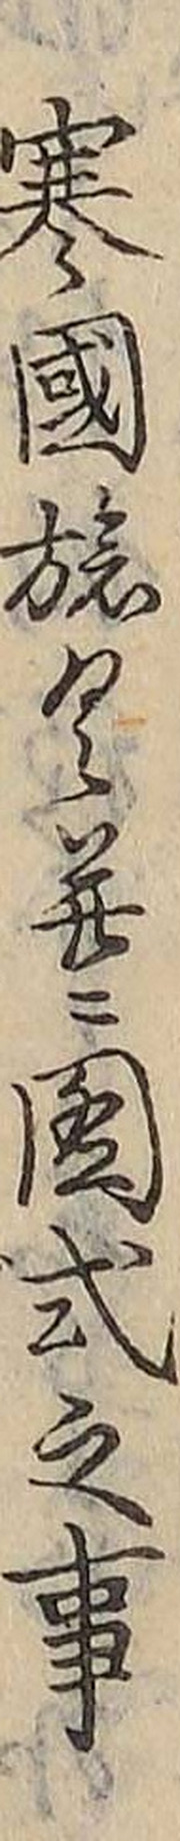寒国旅具并図式之事
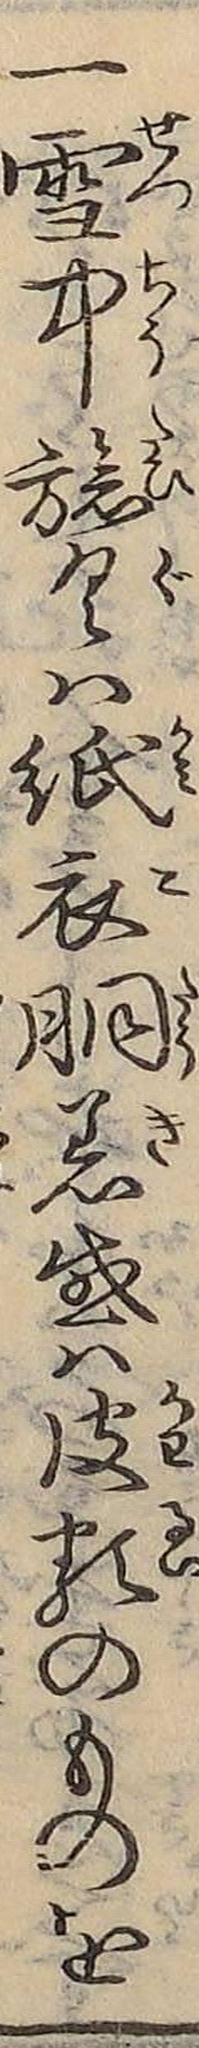一雪中旅具は紙衣胴着或は皮類のものを
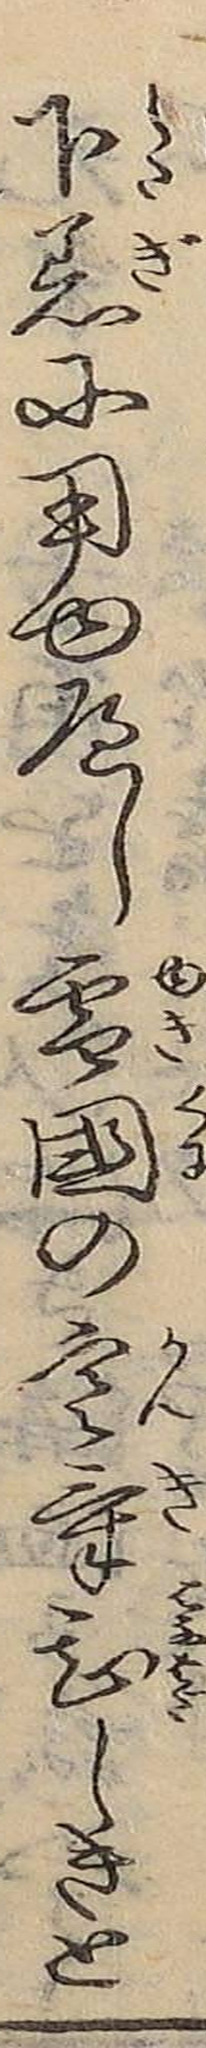下着に用ゆへし雪国の寒気甚しきと
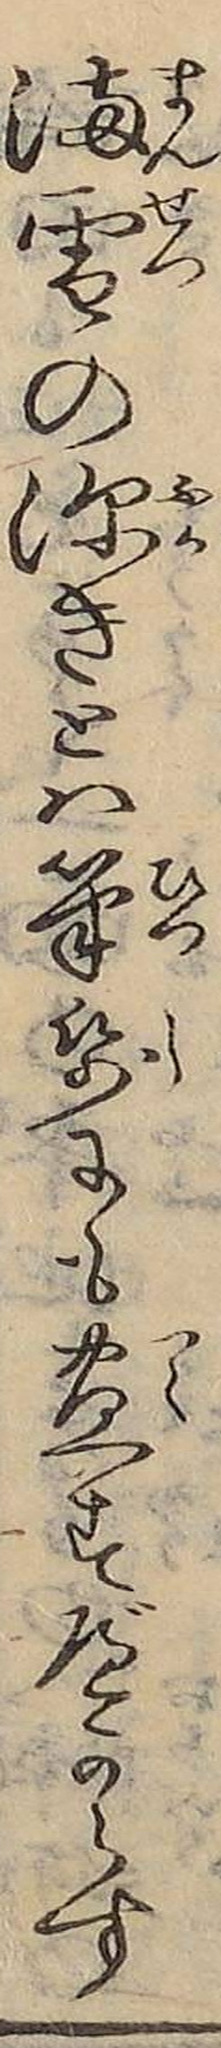満雪の深きとは筆紙にも尽すべからす

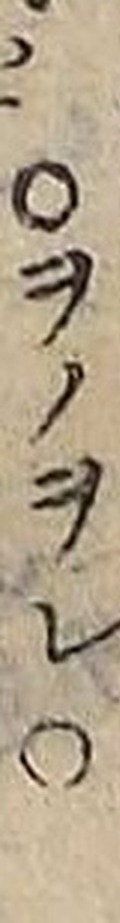○ヲノヲレ○
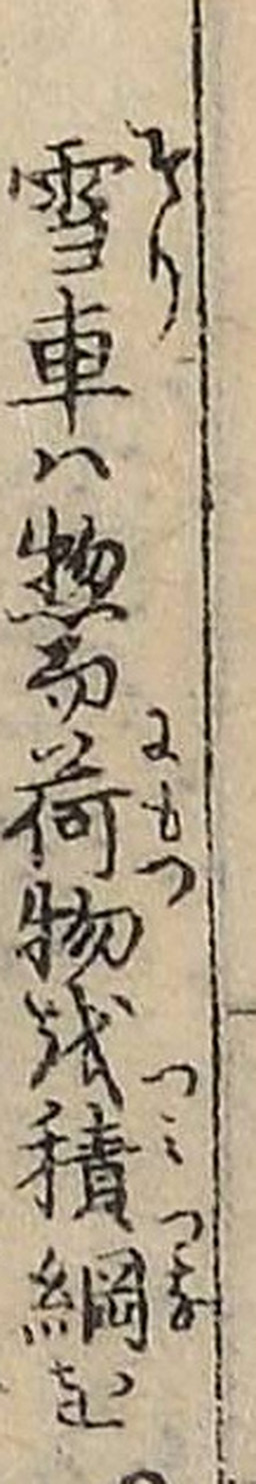雪車は惣而荷物を積綱を
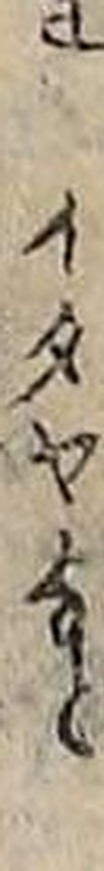イ夕ヤなと
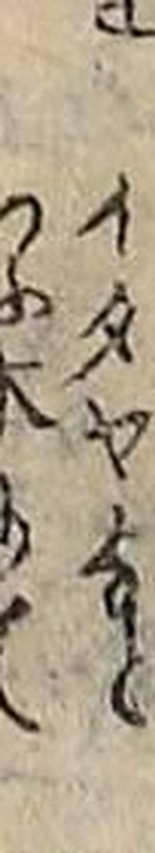いふ木にて
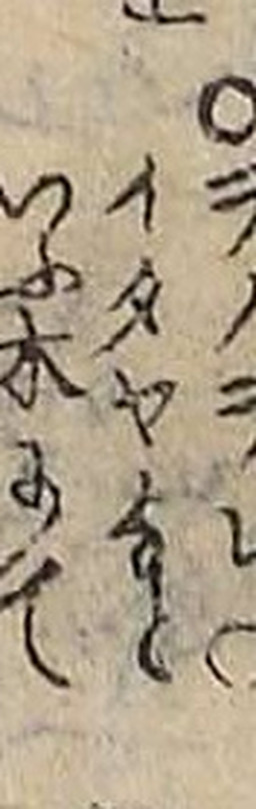いふ木にて
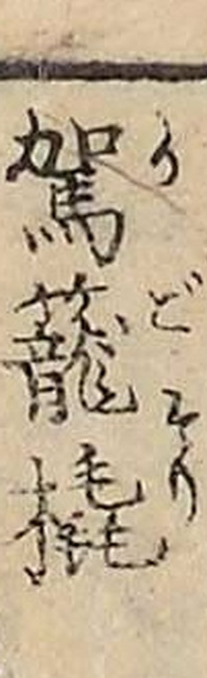駕籠橇
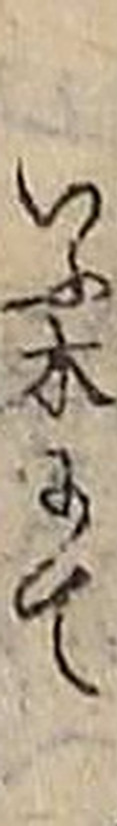いふ木にて
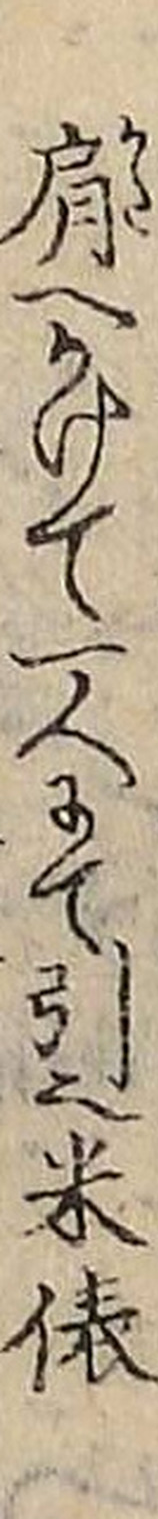肩へかけて一人にて引也米俵
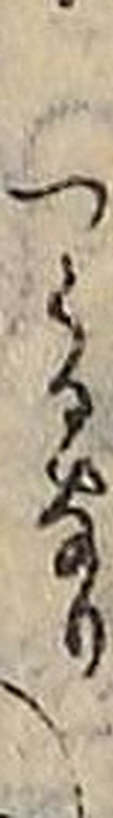つくるなり
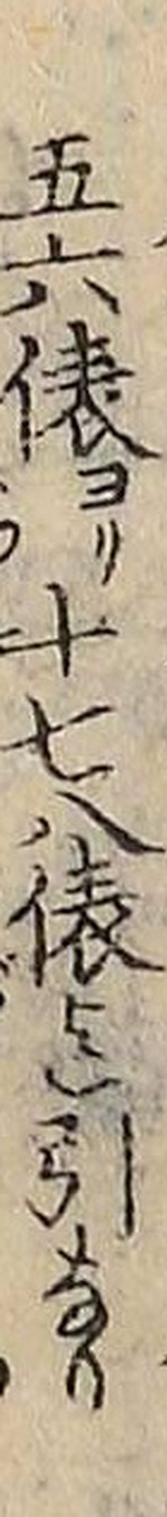五六俵十七八俵迄引なり
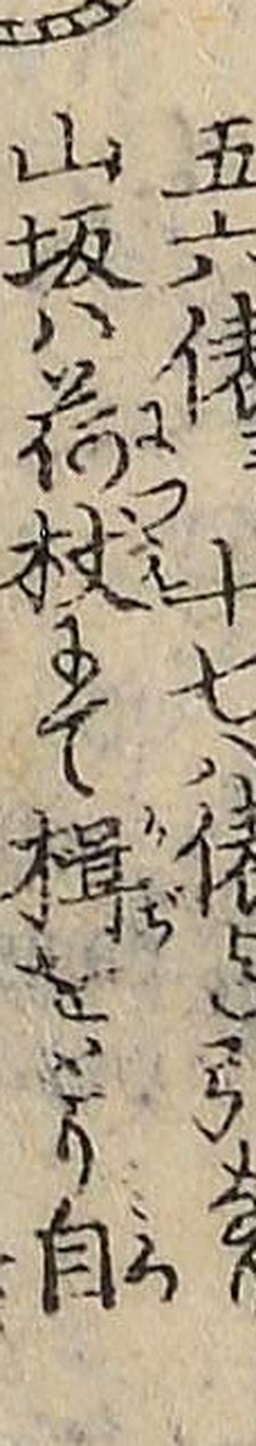山坂は荷杖にて楫をとり自
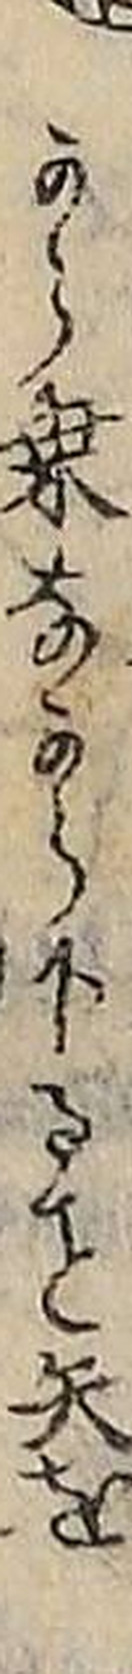から乗なから下ること矢を
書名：旅行用心集
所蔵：神戸大学附属図書館 国文学研究資料館
